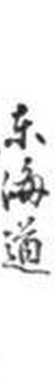東海道
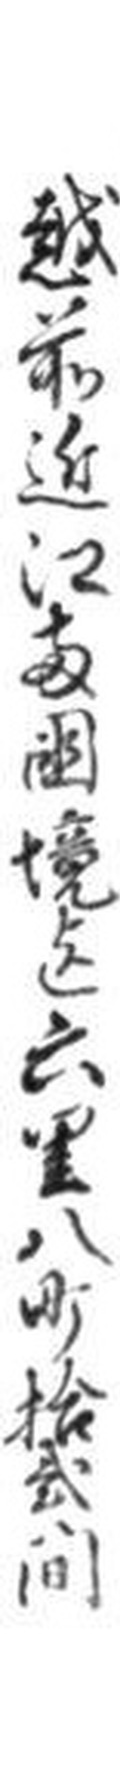越前近江両国境迄六里八町拾弐間
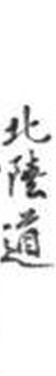北陸道
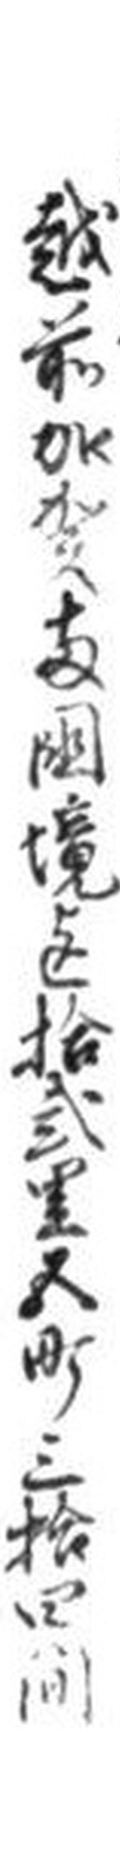越前加賀両国境迄拾弐里五町三拾四間
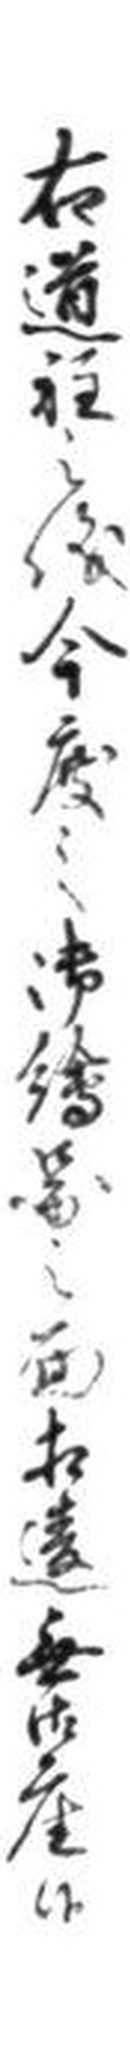右道程之儀今度之御絵図之面相違無御座候
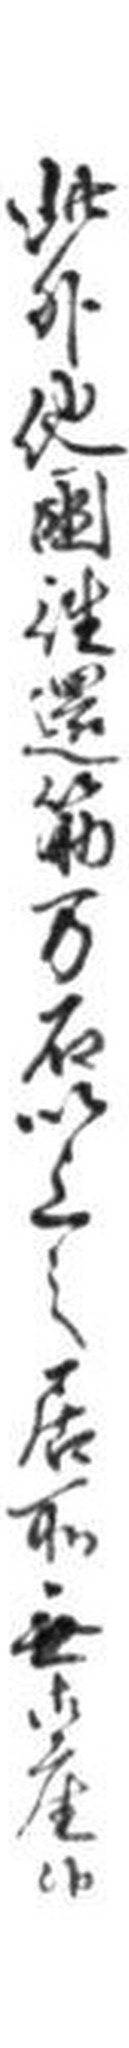此外他国往還筋万石以上之居所無御座候
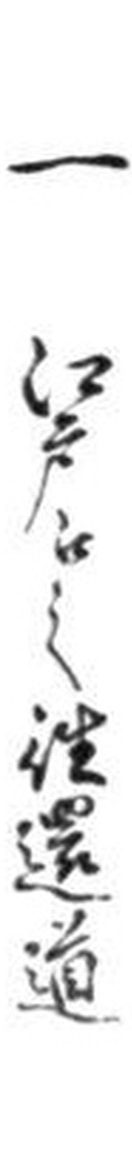一江戸江之往還道
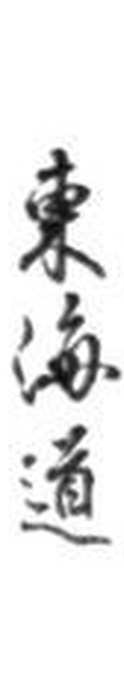東海道
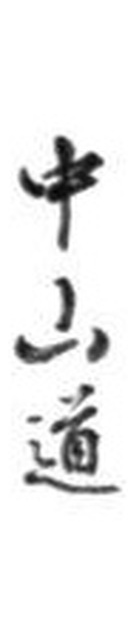中山道
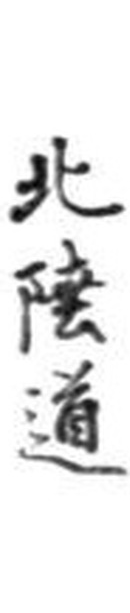北陸道
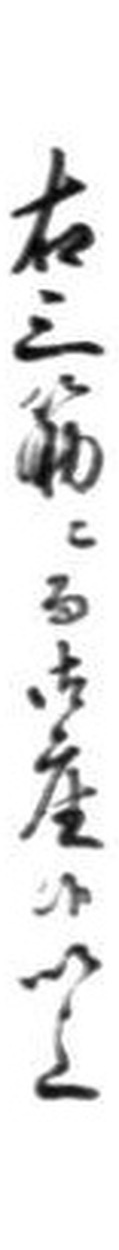右三筋ニ而御座候以上
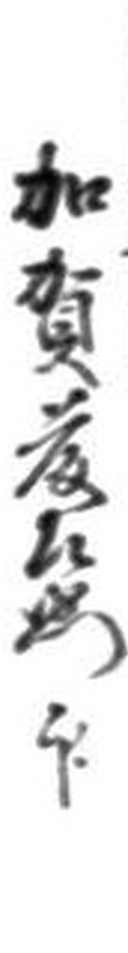加賀藤左衛門印
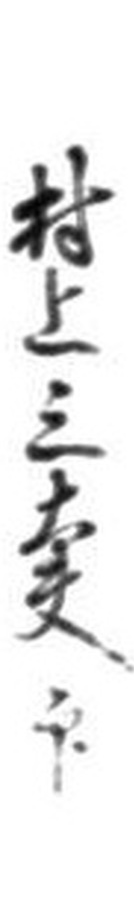村上三太夫印
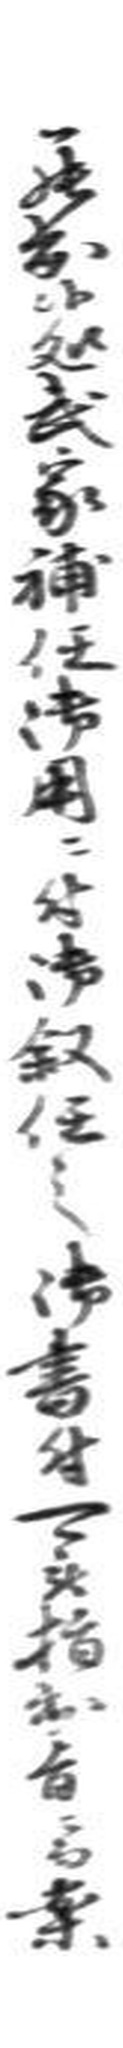罷出候処武家補任御用ニ付御叙任之御書付可被指出旨ニ而案
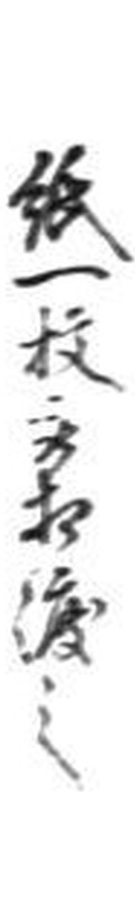紙一枚被相渡之

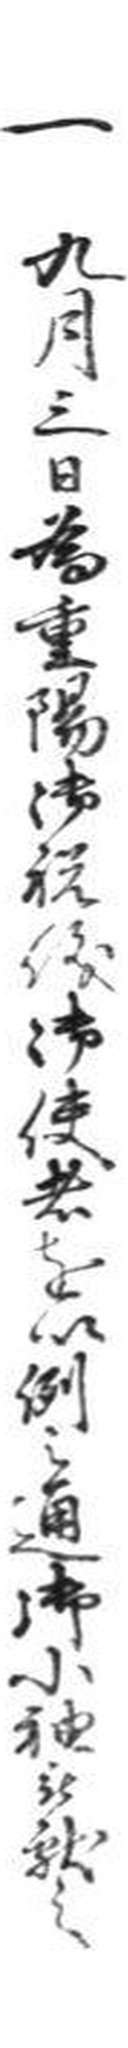一九月三日為重陽御祝儀御使者を以例之通御小袖被献之
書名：家譜 二十二 吉品公 従元禄十五年到同十六年
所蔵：福井県文書館 Fukui Prefectural Archives
